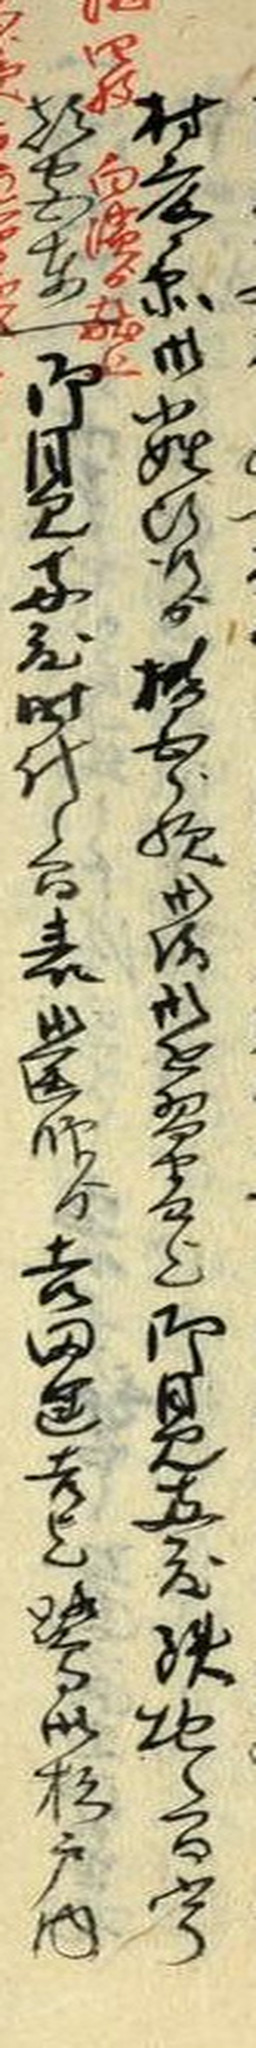都宮東一御目見両度時計之間表御医師ゟ吉田運吉迄鷺御杉戸内
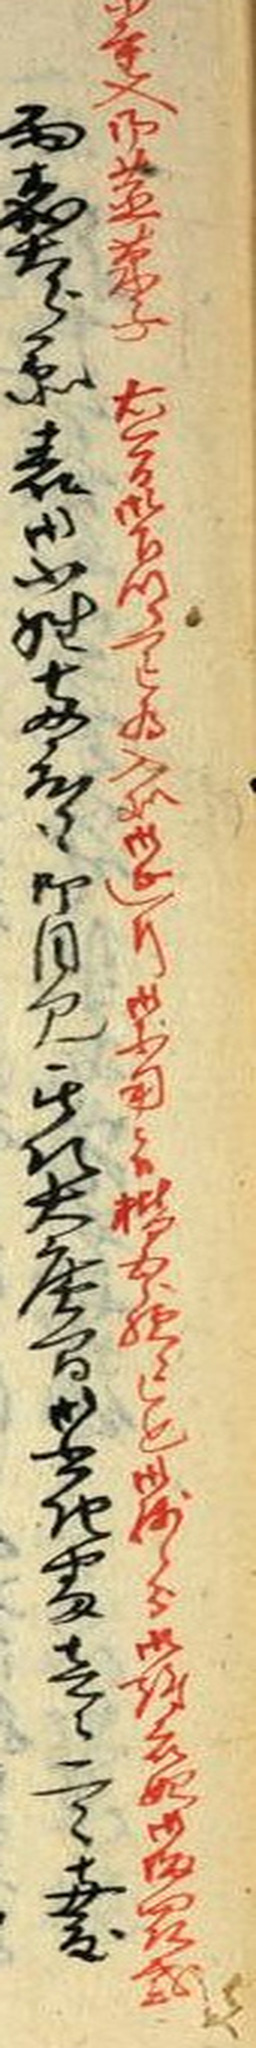雨森太郎兵衛表御小姓両度ツヽ御目見其次大広間御書院番壱々二々両度
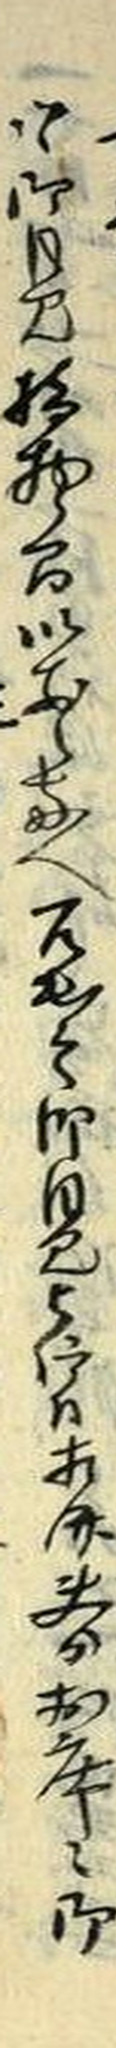ツヽ御目見指物之間以前之両人召出之御目見被仰付相済夫ゟ於席々御
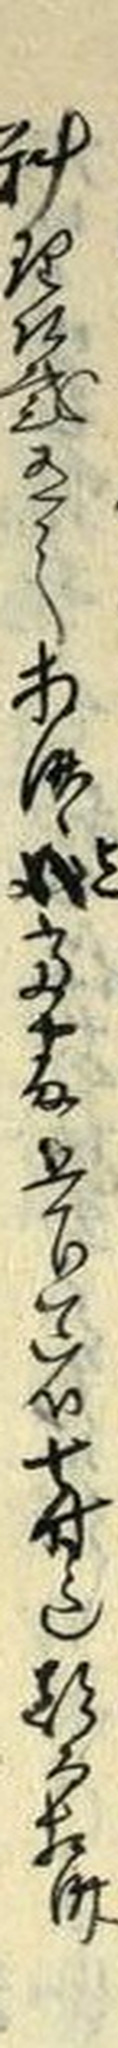料理頂戴有之相済候迄当番上下着七時過都而相済
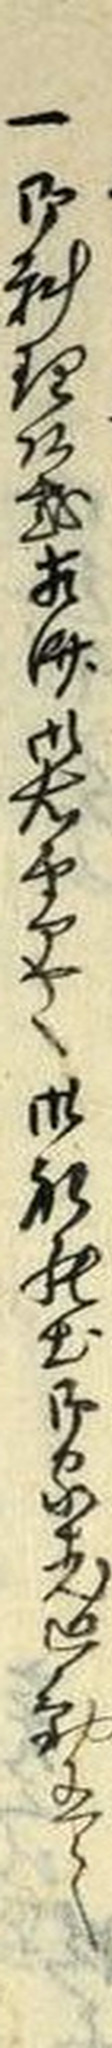一御料理頂戴相済御右筆部やへ御礼罷出御家老廻勤有之
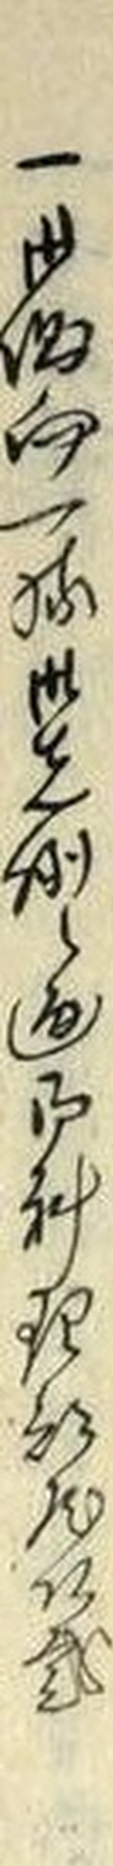一御側向一統御先例之通御料理部屋頂戴
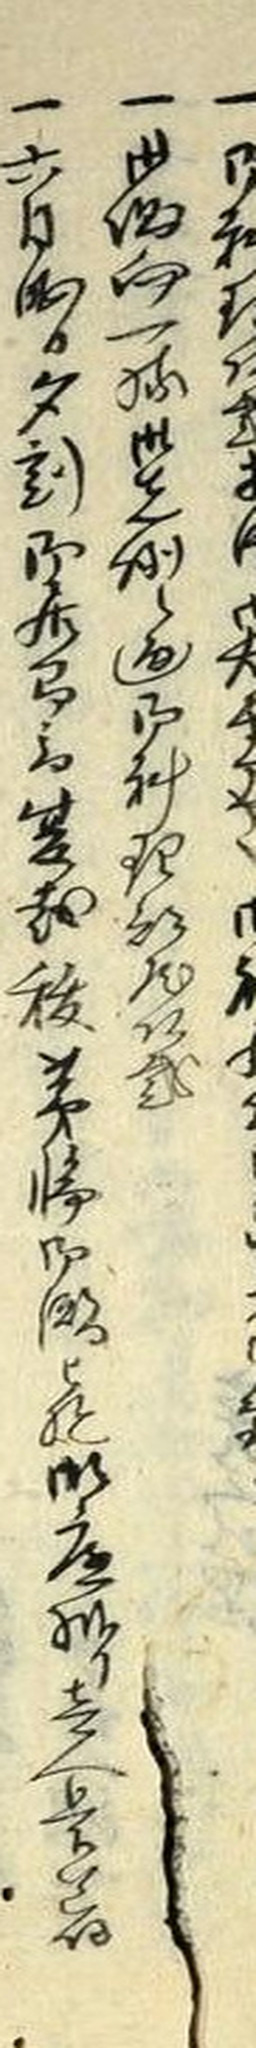一六月晦日夕刻御居間ニ而夏越祓茅輪御潜被遊御庭掛り壱人上下着
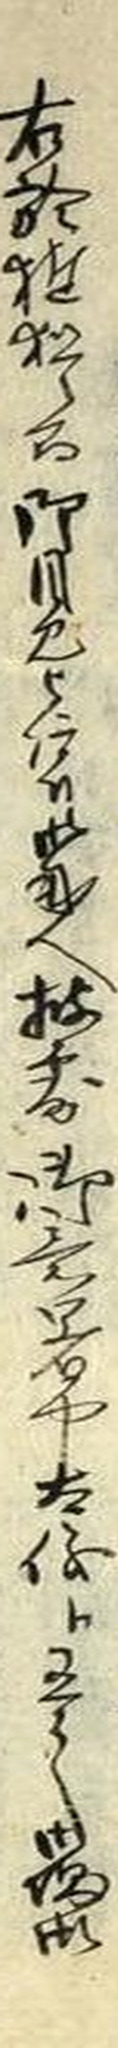右於韃靼之間御目見被仰付御用人披露御意暑中太儀ト有之御側御
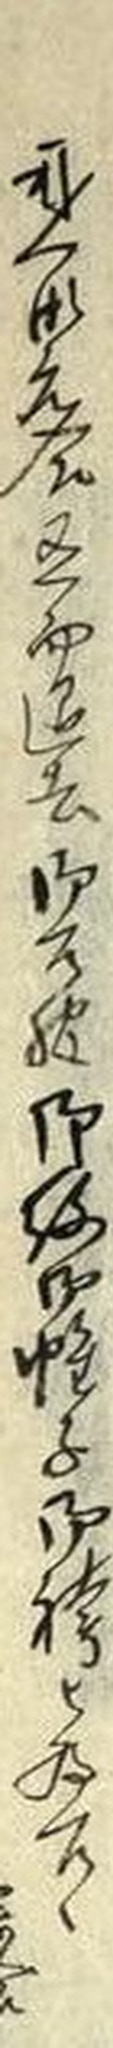用人御取合有而退去御召服御紋御帷子御袴被為召候
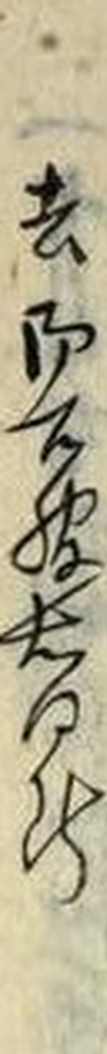去御召服右同断

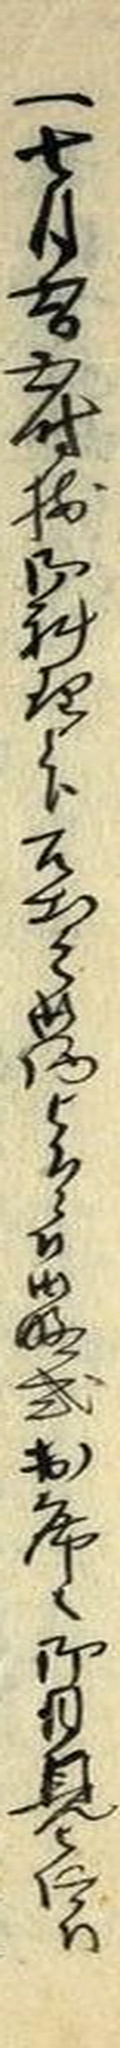一七月五日五時揃御料理被下召出之御酒被下候ニ付御略式於席々御目見被御付
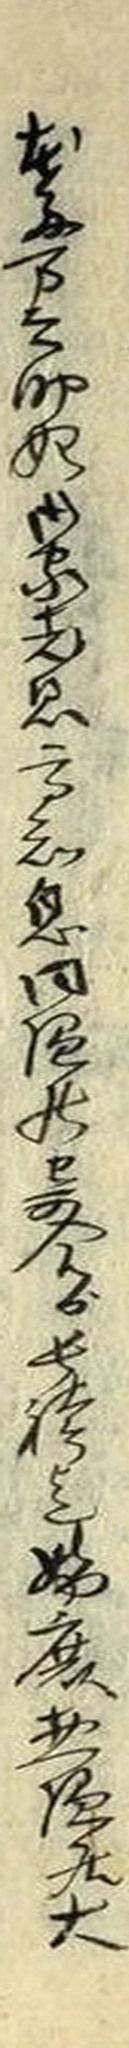本多万之助始御家老息高知息同隠居寄合ゟ長袴迄嫡庶惣隠居大
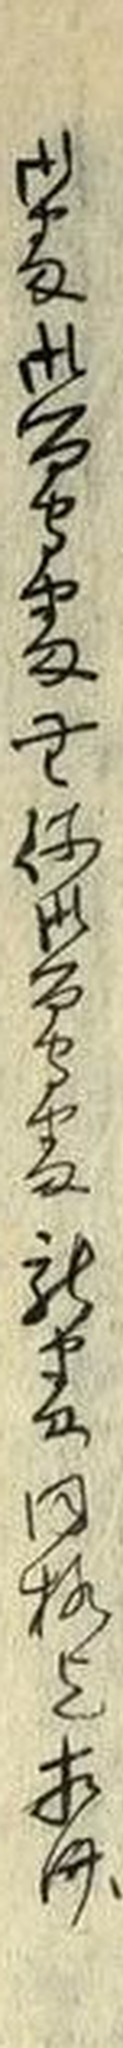御番御留守番無役御留守番新番同格迄相済
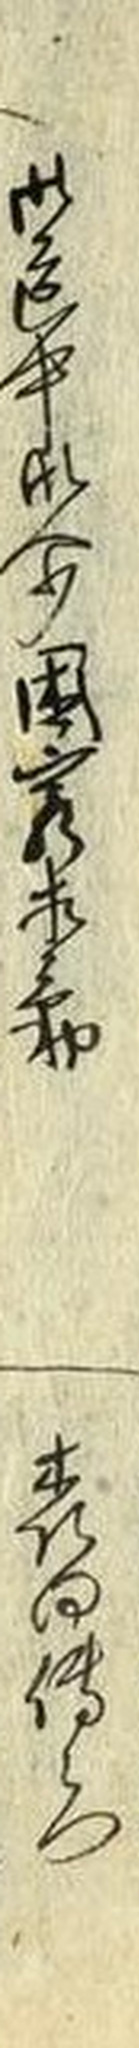御道中御人少困窮相勤森田伝右衛門
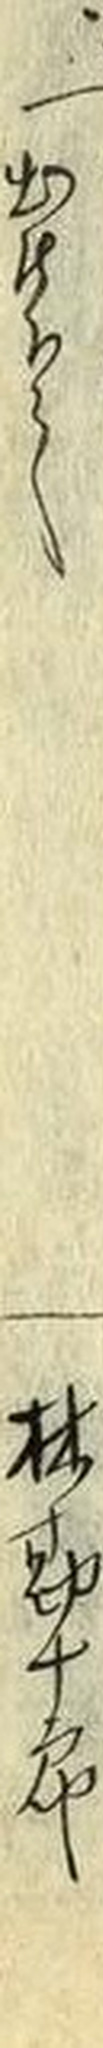出被下之林勘十郎
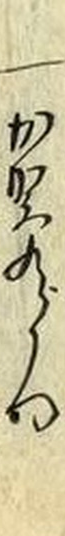加賀九郎右衛門
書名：少傅日録抄（斉善付側向頭取日記、江戸并道中、初入在国、逝去後…
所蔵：福井県文書館 Fukui Prefectural Archives
